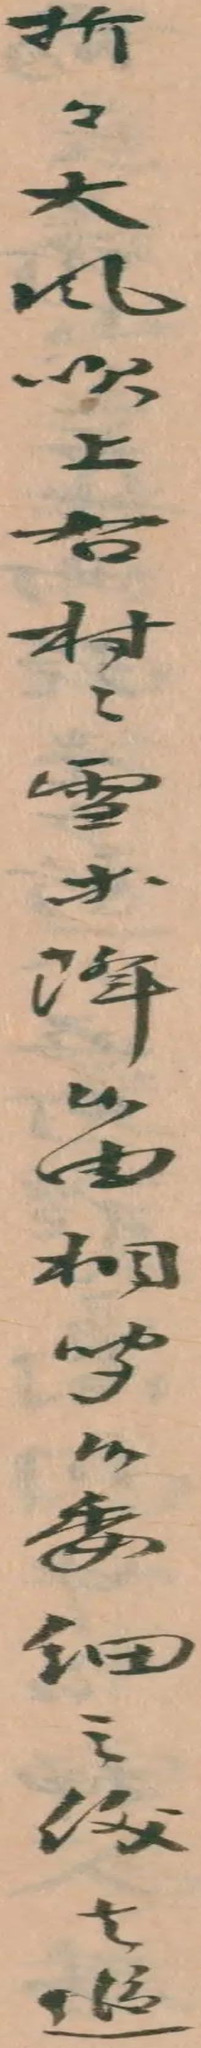折々大風吹上右村々雪相降候由相聞候委細之儀者追
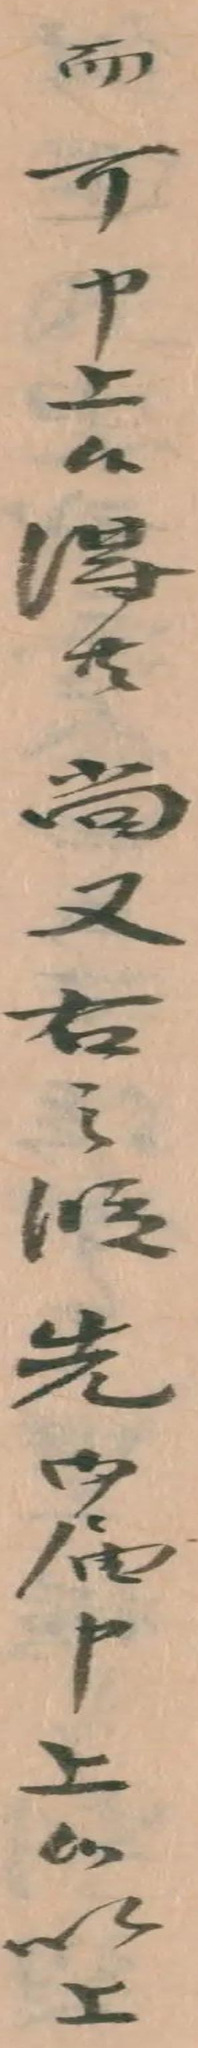而可申上候得共尚又右之段先御届申上候以上
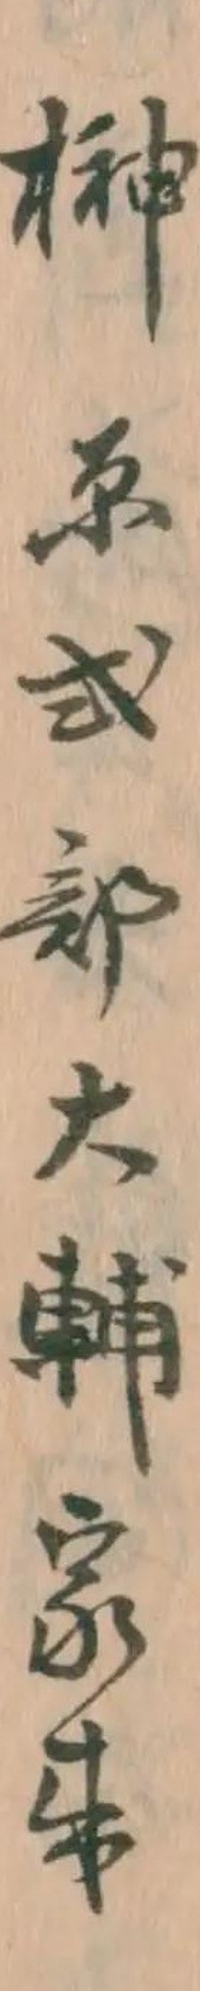榊原式部大輔家来
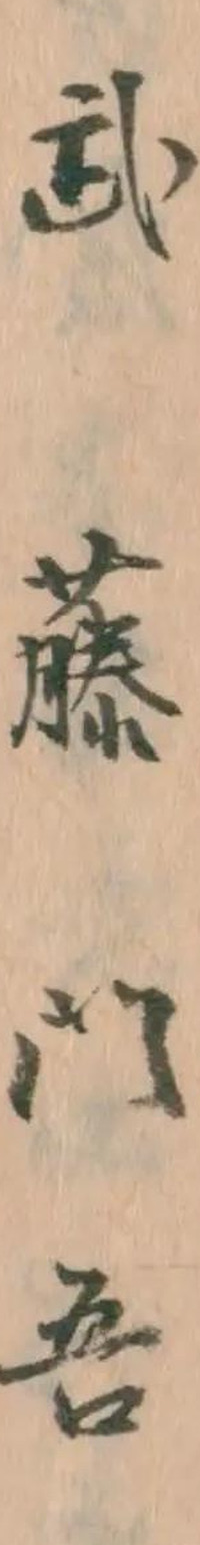武藤門吾
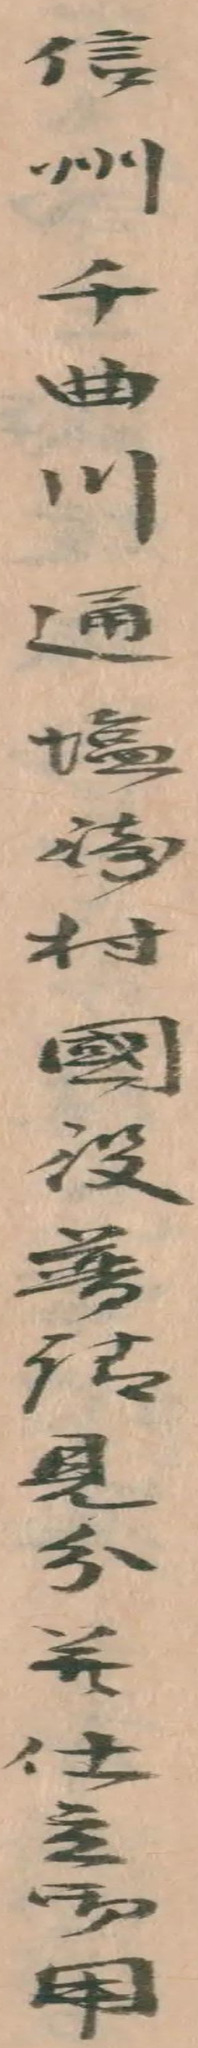信州千曲川通塩崎村国役御普請見分并仕立御用
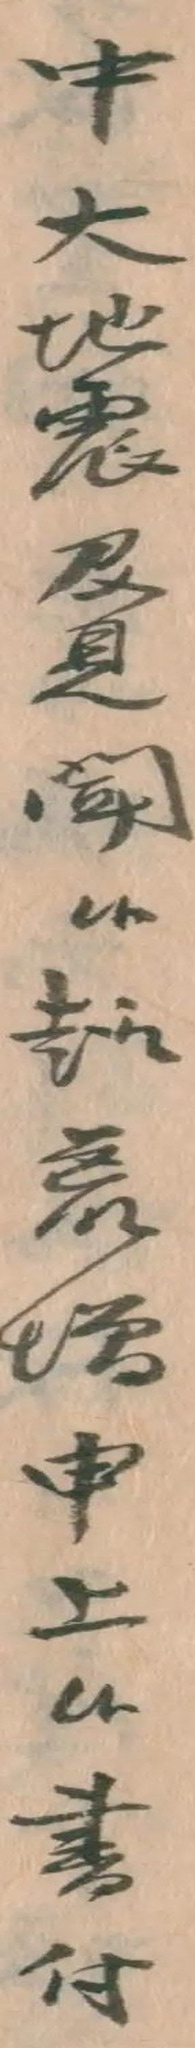中大地震及見分候趣荒増申上候書付
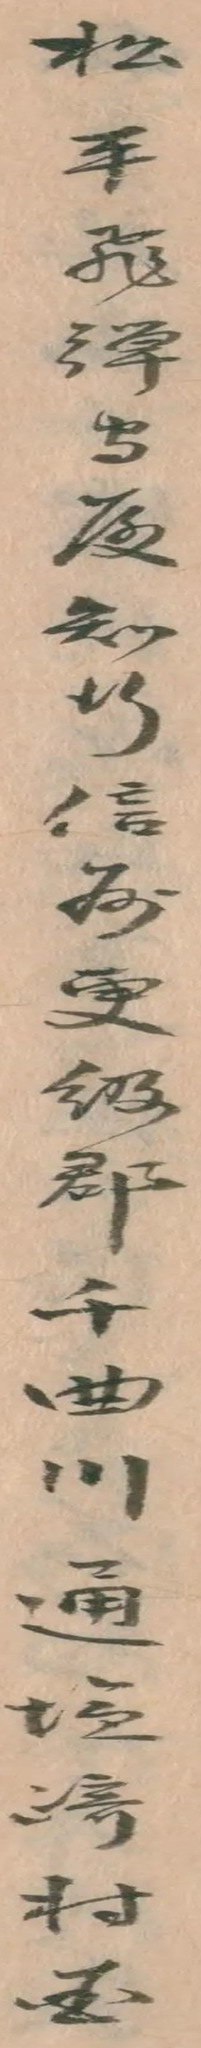松平飛騨守殿知行信州更級郡千曲川通塩崎村国
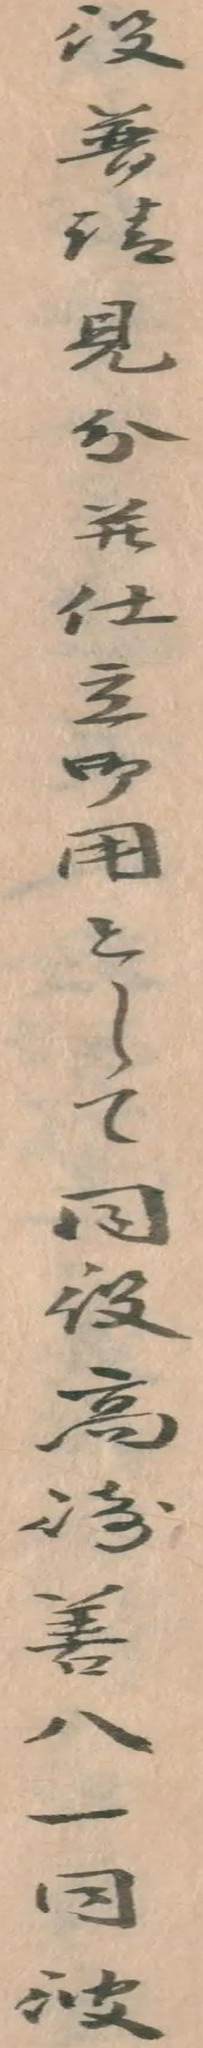役普請見分并仕立御用として同役高崎善八一同彼
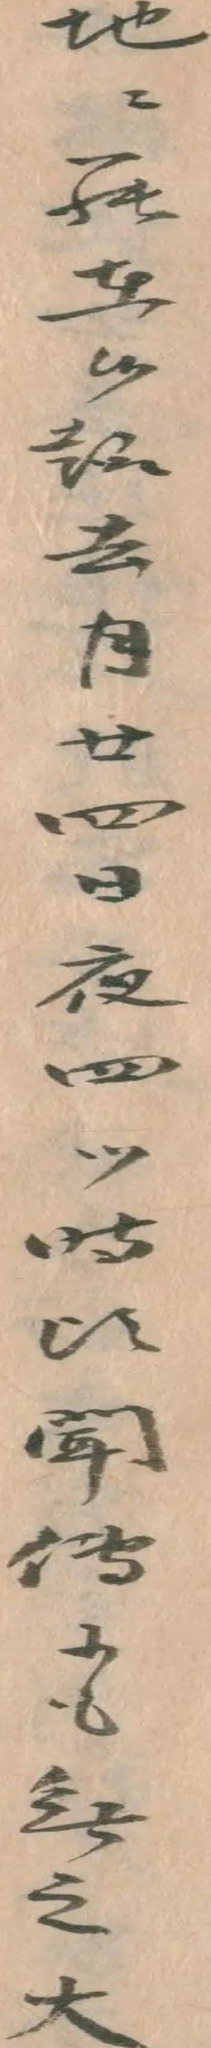地ニ罷在候趣去月廿四日夜四時頃聞伝にも無之大
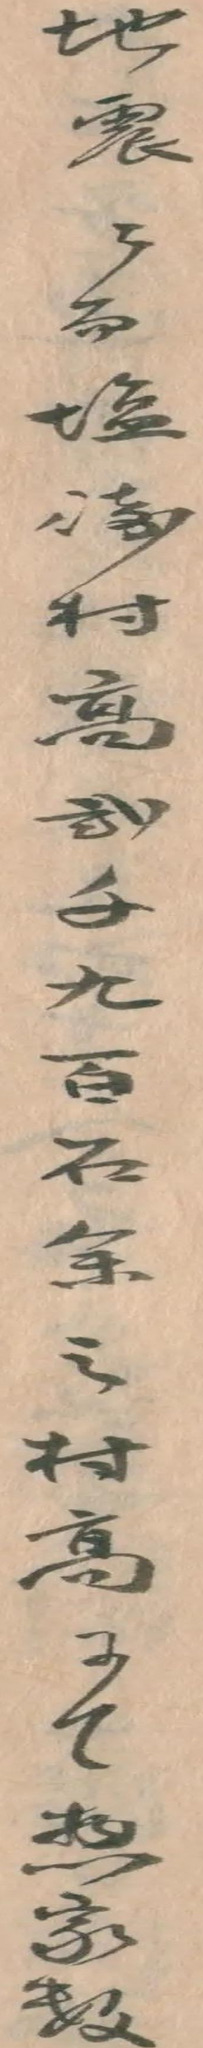地震ニ而塩崎村高弐千九百石余之村方にて惣家数
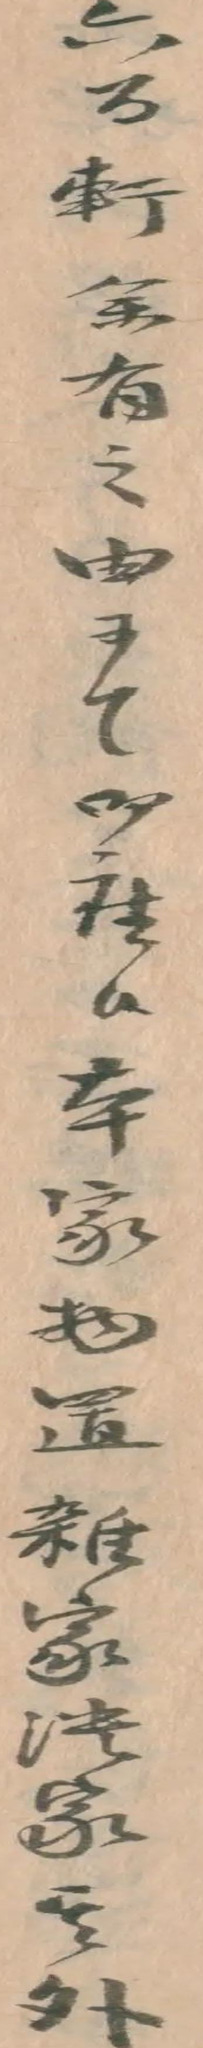六百軒余有之候由にて御座候本家物置雑家潰家其外

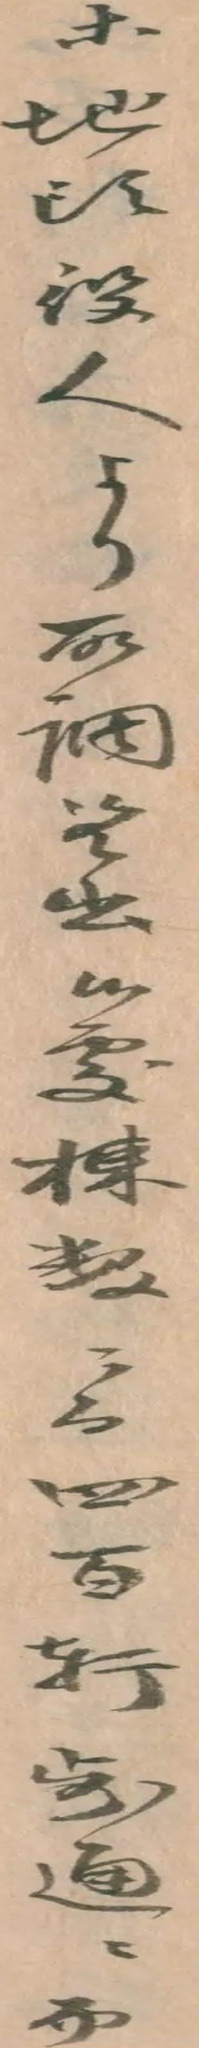等地頭役人より取調差出候処棟数二而四百軒歩通二而
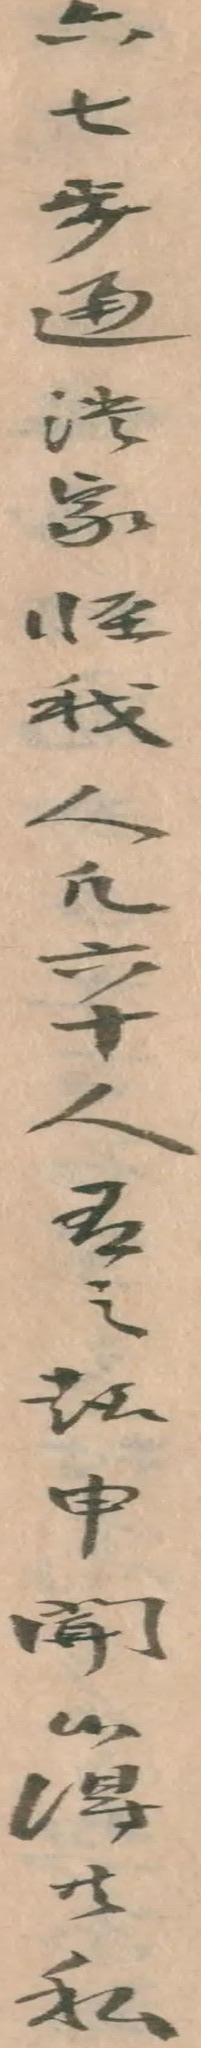六七歩通潰家怪我人凡六十人有之趣申聞候得共私
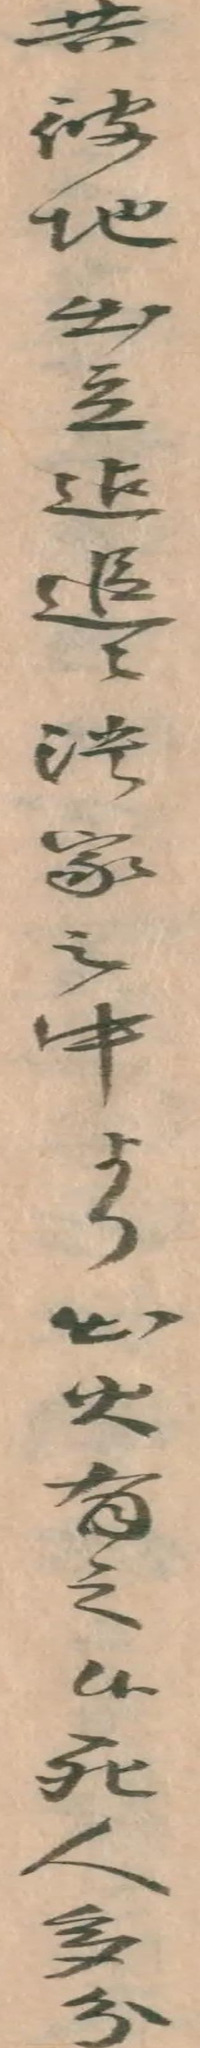共彼地出立迄追々潰家之中より出火有之候死人多分
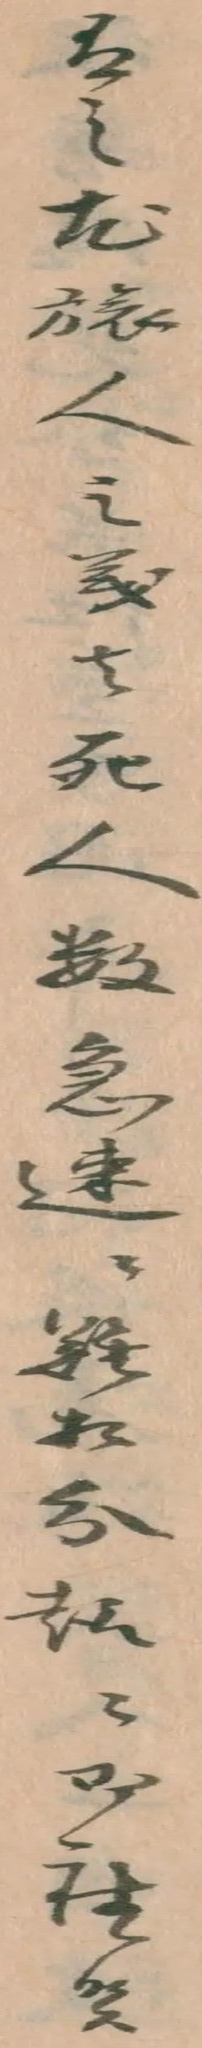有之尤旅人之儀者死人数急速二難相分趣二候
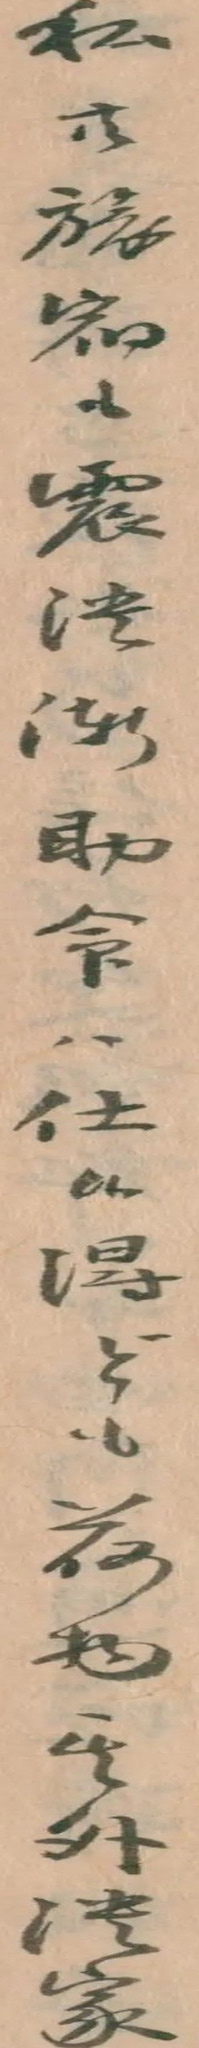私共旅宿も震潰漸助命ハ仕候得ども荷物外潰家
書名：地災撮要. 巻3(地震之部)-巻4(噴火之部)
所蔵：国立国会図書館 National Diet Library, JAPAN
